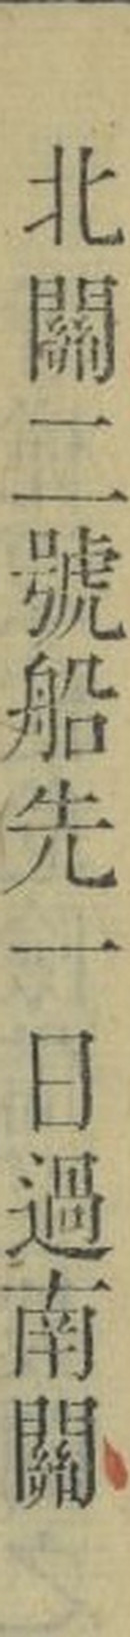北關二號船先一日過南關
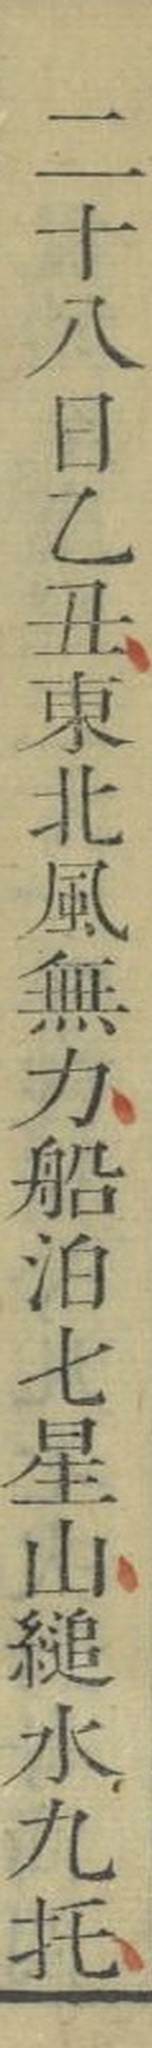二十八日乙丑東北風無力船泊七星山縋水九托
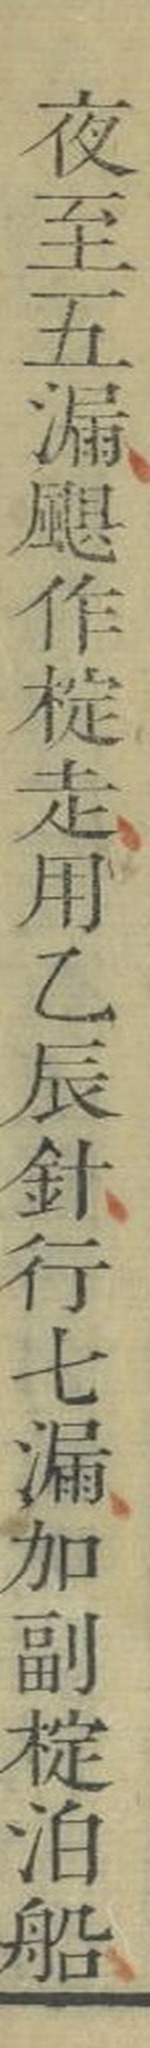夜至五漏颶作椗走用乙辰針行七漏加副椗泊船
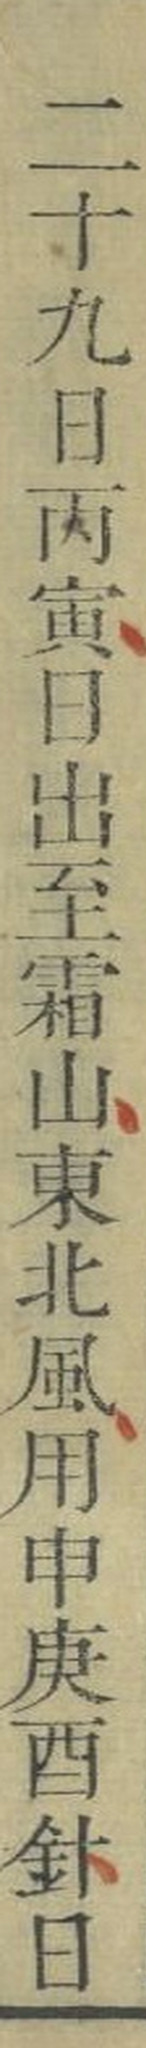二十九日丙寅日出至霜山東北風用申庚酉針日
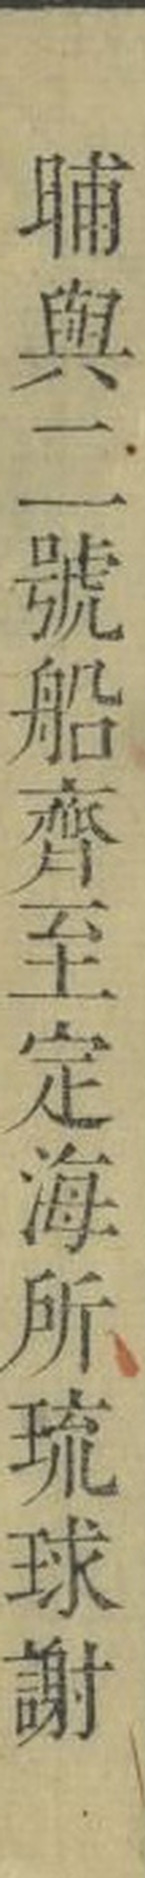晡與二號船齊至定海所琉球謝
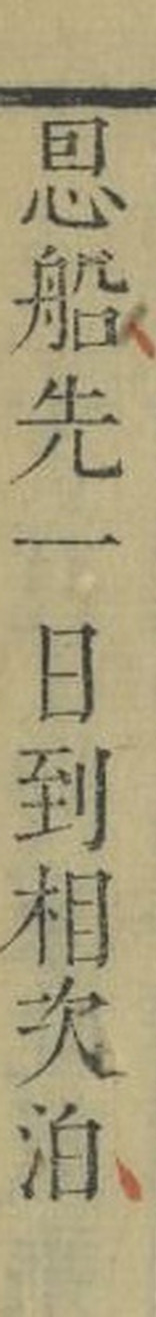㤙船先一日到相次泊

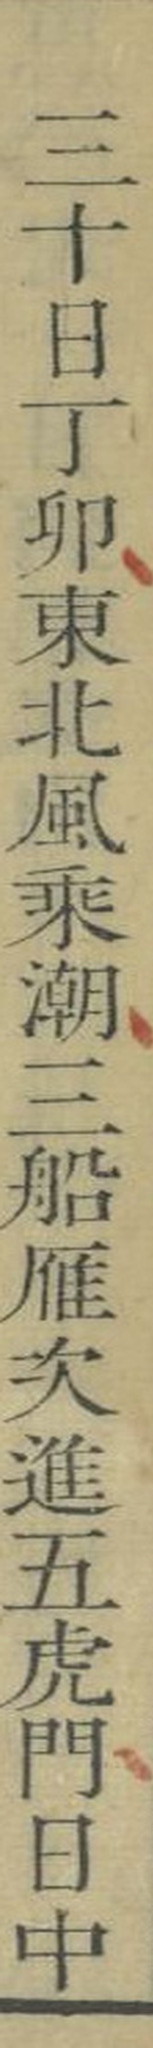三十日丁卯東北風乘潮三船雁次進五虎門日中
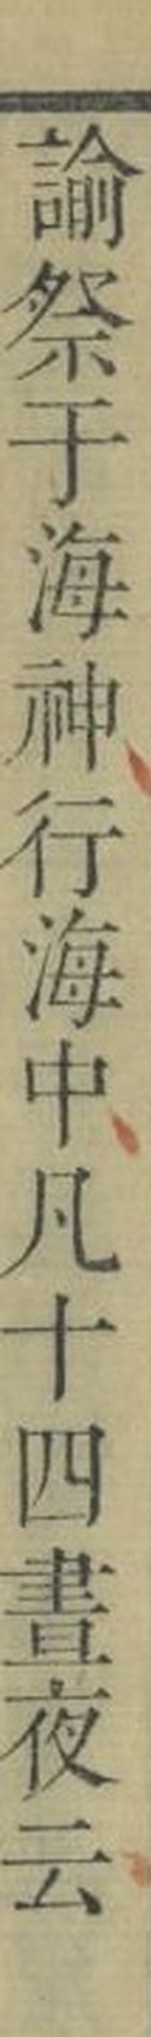諭祭于海神行海中凡十四晝夜云
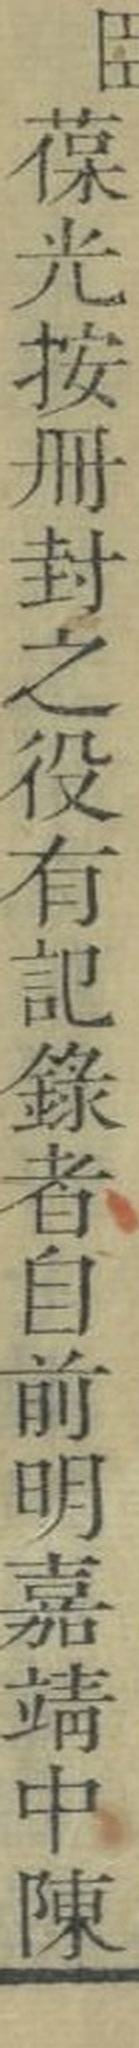臣葆光按冊封之役有記錄者自前明嘉靖中陳
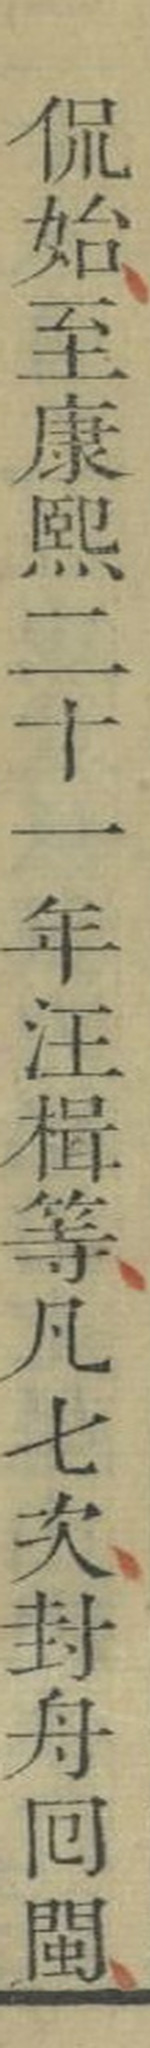侃始至康熙二十一年汪楫等凡七次封舟囘閩
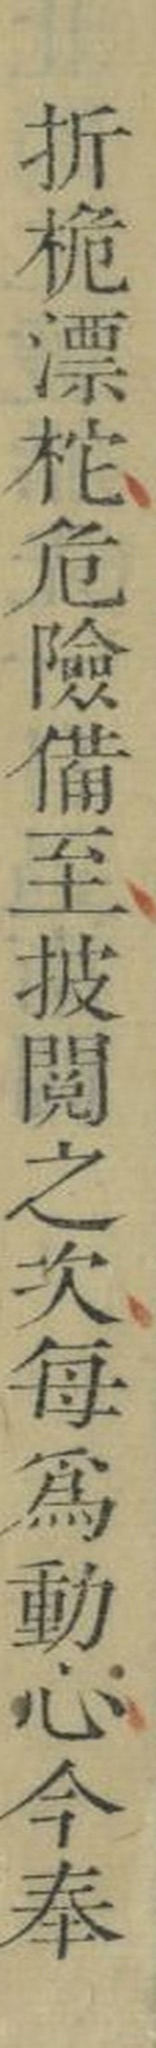折桅漂柁危險備至披閲之次每爲動心今奉
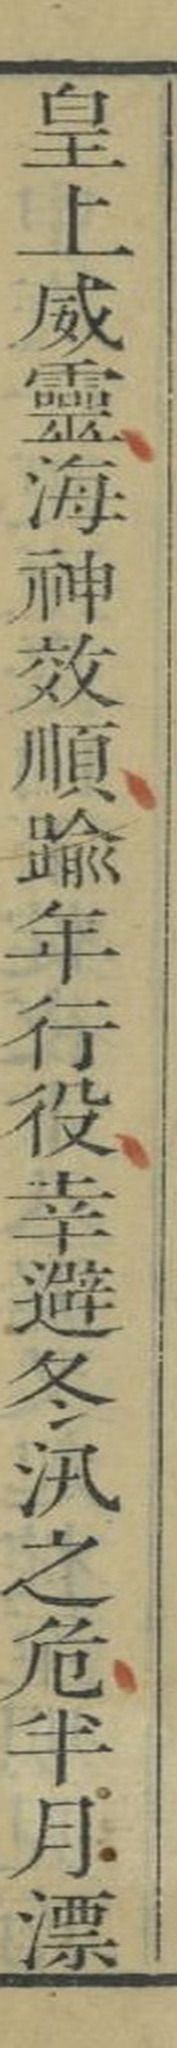皇上威靈海神效順踰年行役幸避冬汛之危半月漂
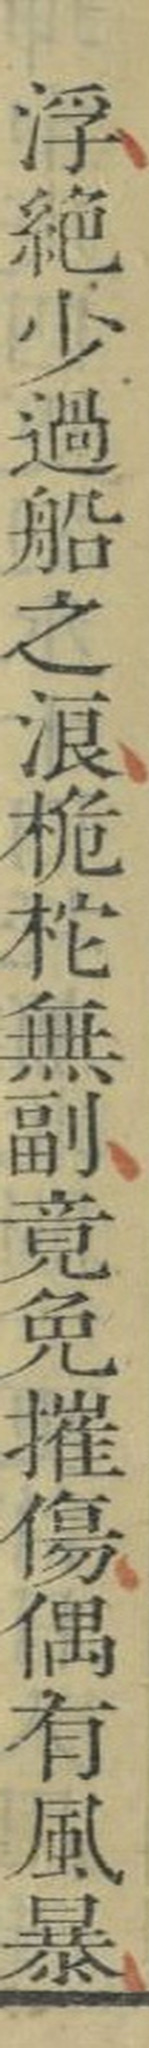浮絶少過船之浪桅柁無副竟免摧傷偶有風暴
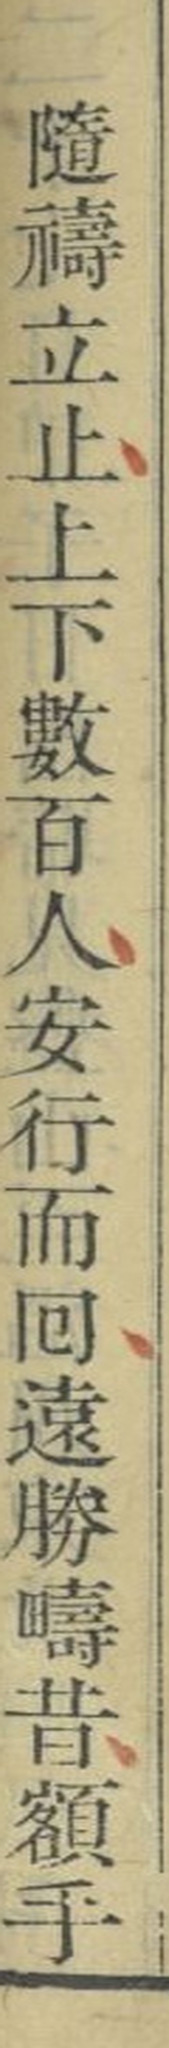隨禱立止上下數百人安行而囘遠勝疇昔額手
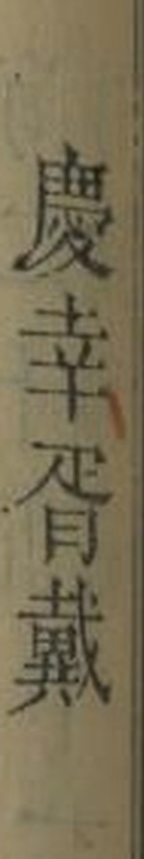慶幸胥戴
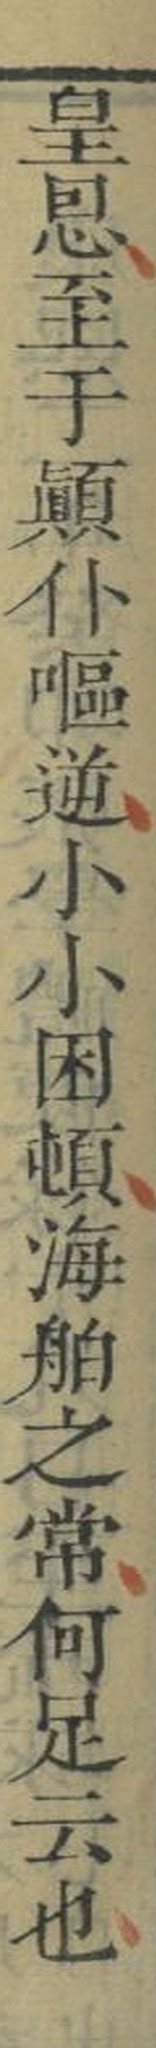皇㤙至于顚仆嘔逆小小困頓海舶之常何足云也
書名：中山伝信録 巻一、巻二
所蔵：University of the Ryukyus Library
